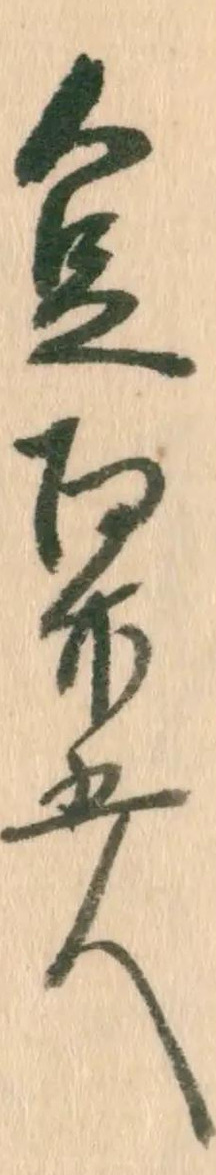一人足百廿五人
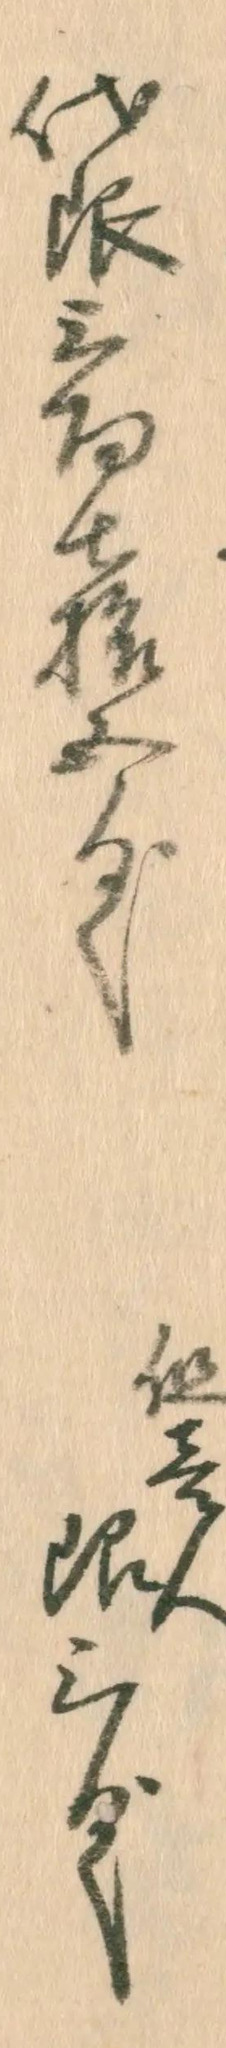代銀三百七拾五匁但壱人銀三匁
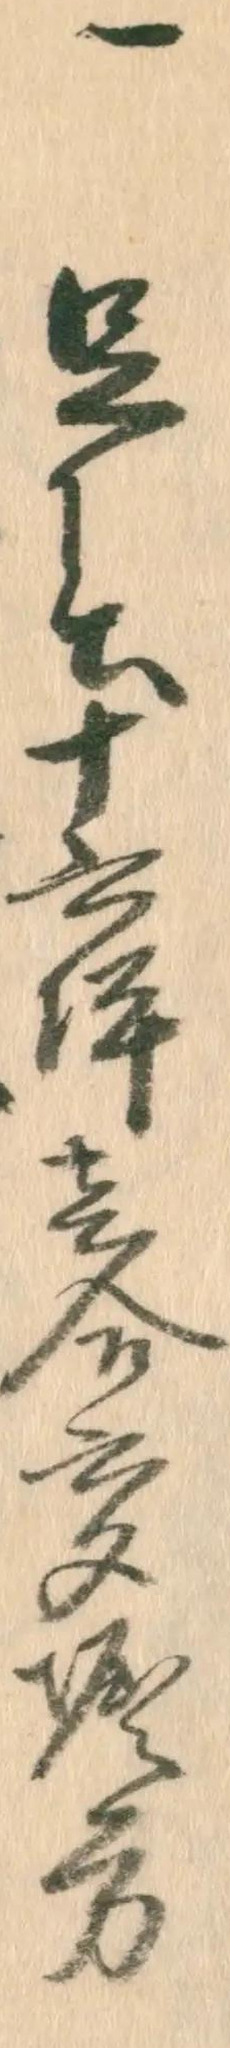一足し土十六坪壱合六勺堀方
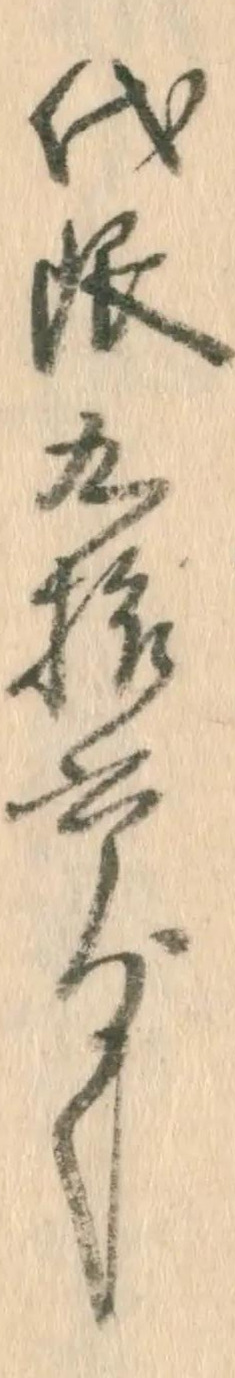代銀九拾六匁但壱人銀同断
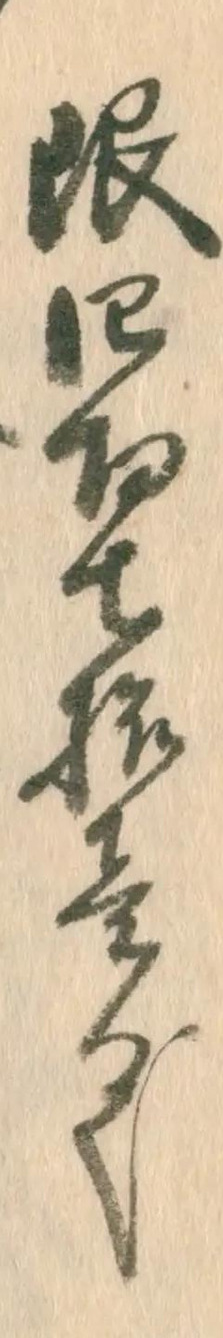〆銀四百七拾壱匁

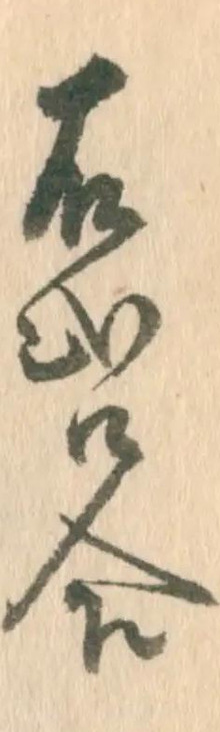右弐口合
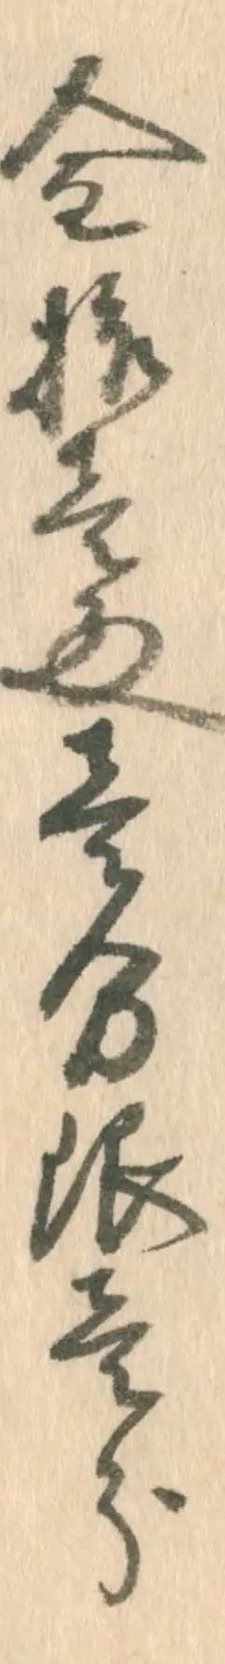金拾壱両壱分銀壱分
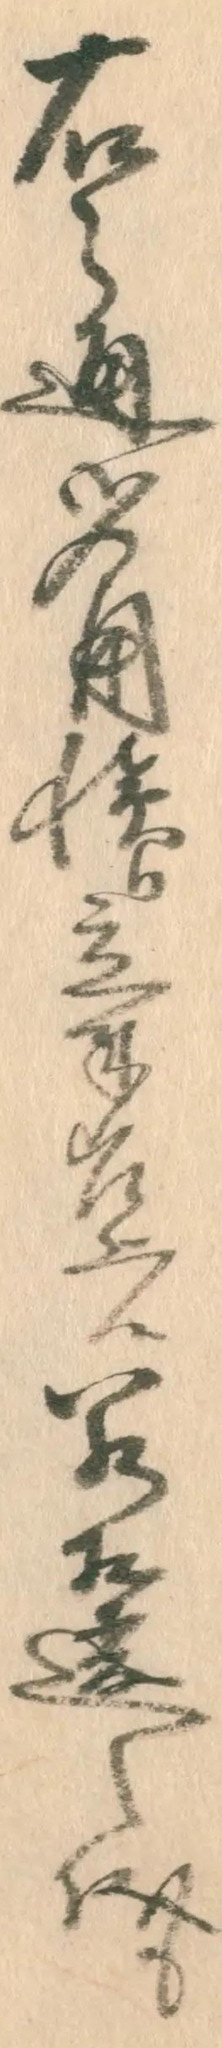右之通御入用積立奉差上候若相違之儀も
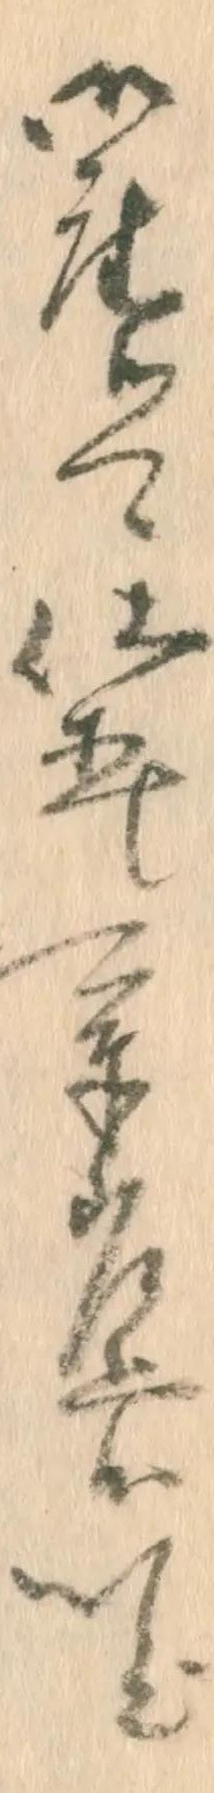御座候ハヽ仕直し可奉差上候以上
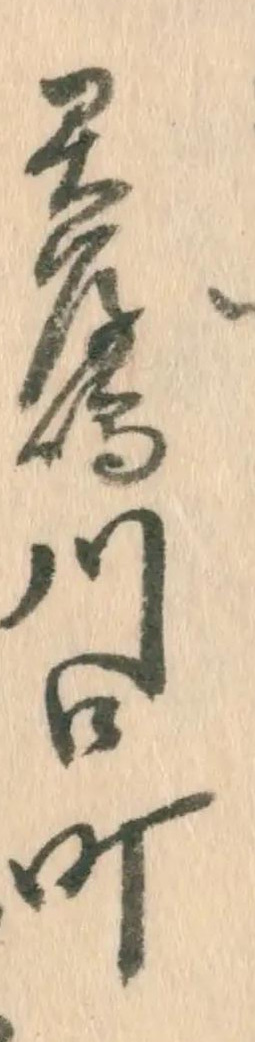霊岸島川口町
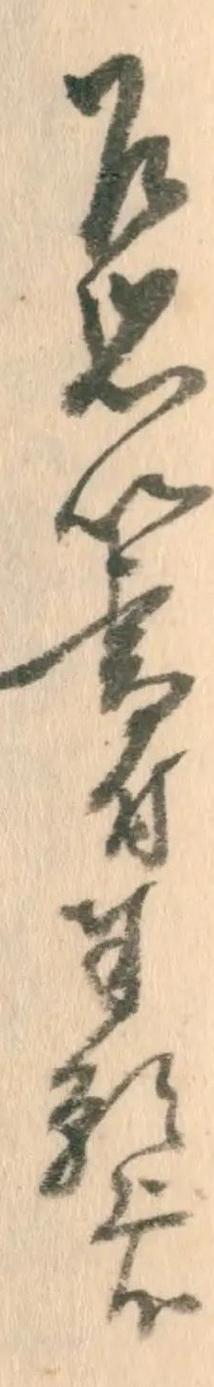乍恐以書付奉願上候
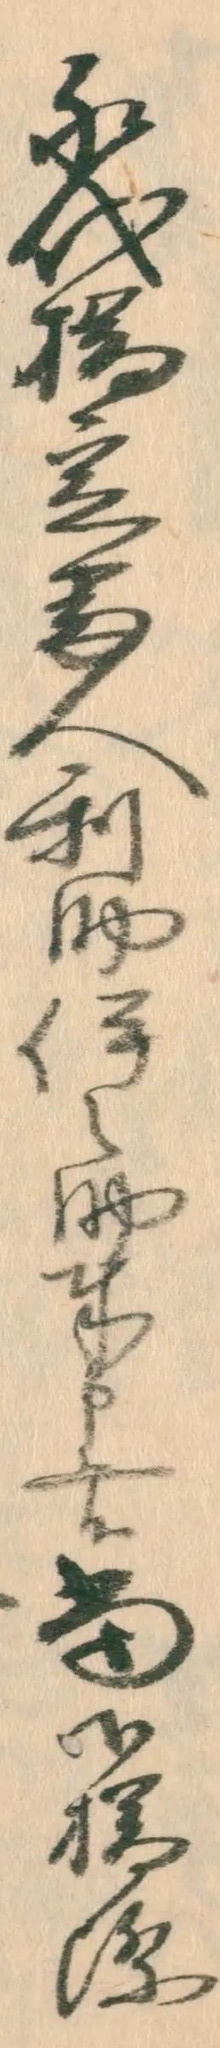永代橋定番人利助伊之助奉申上候当御橋際
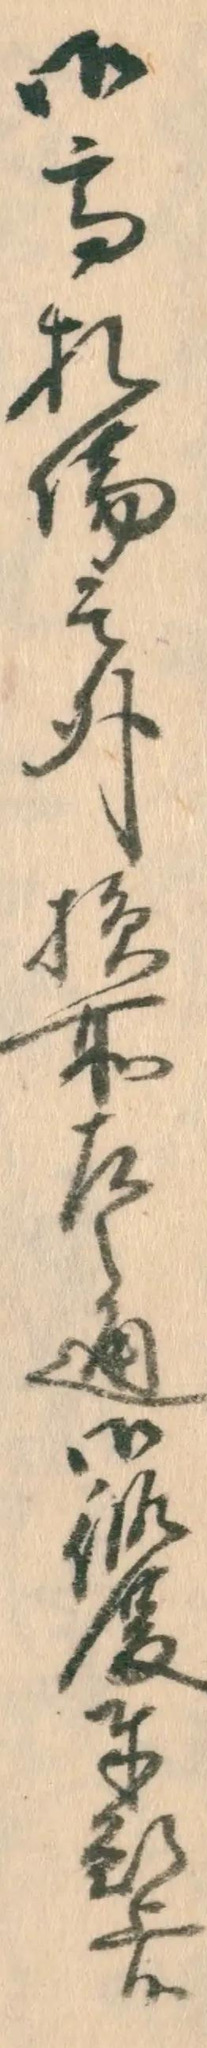御高札場其外損所左之通御修復奉願上候
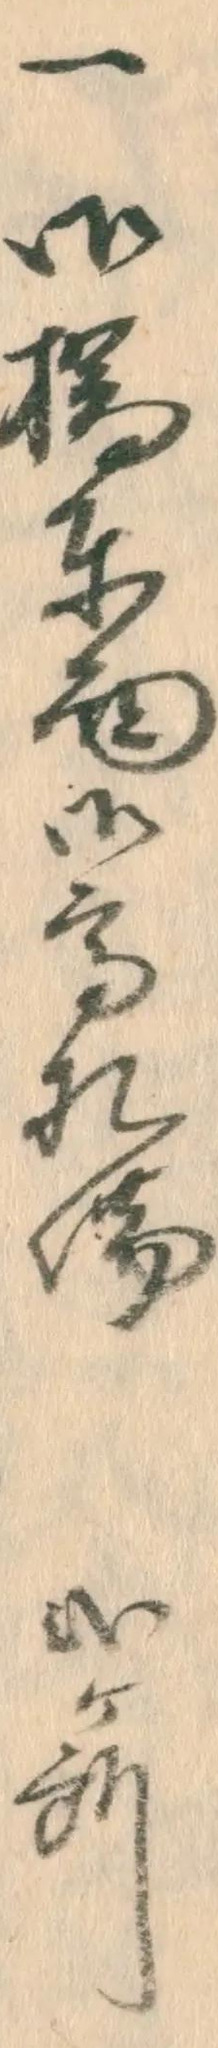一御橋東西御高札場弐ケ所
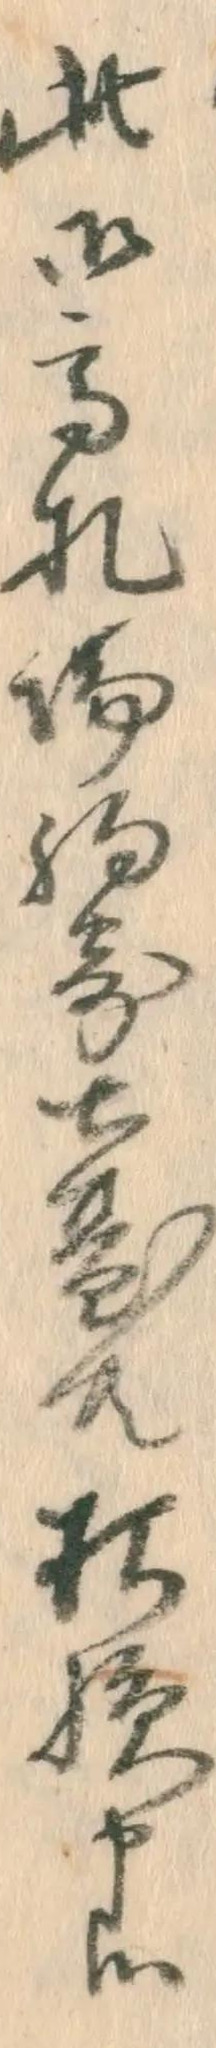此御高札場駒寄土台共朽損申候
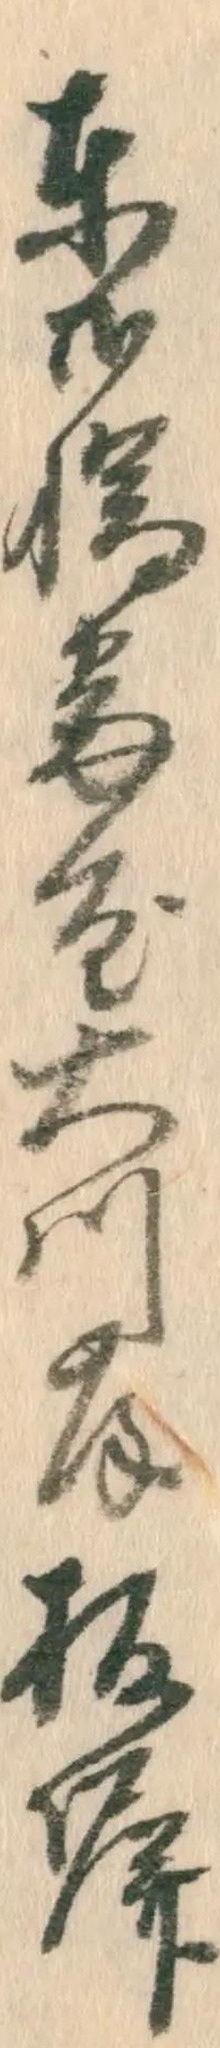一東御橋番屋大川岸板塀
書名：三橋 17巻. [7] 三橋小破御修復書留　但御奉行御掛リ替地震潰橋番屋　嘉永四亥年より安政二卯年迄　上
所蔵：国立国会図書館 National Diet Library, JAPAN
